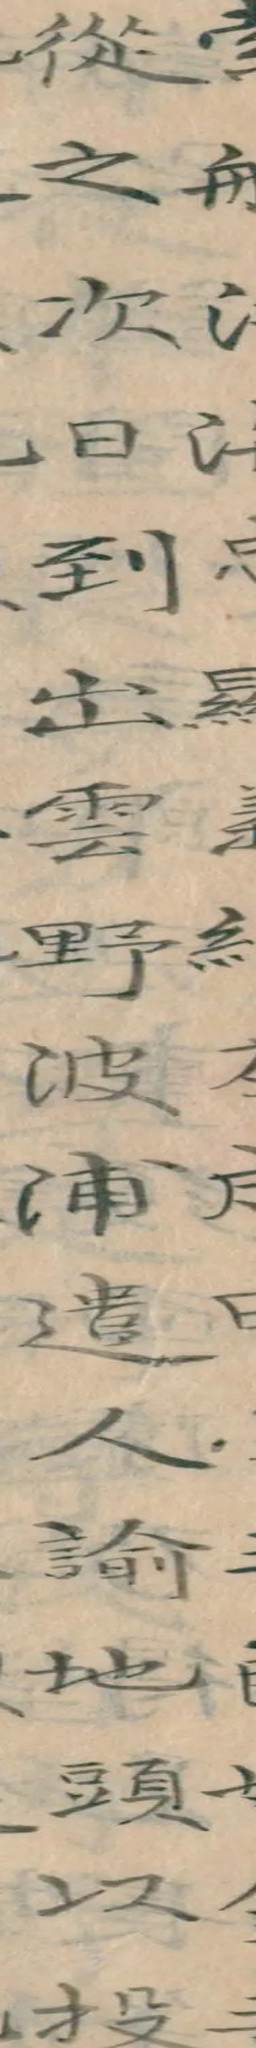従之次日到出雲野波浦遣人諭地頭以投
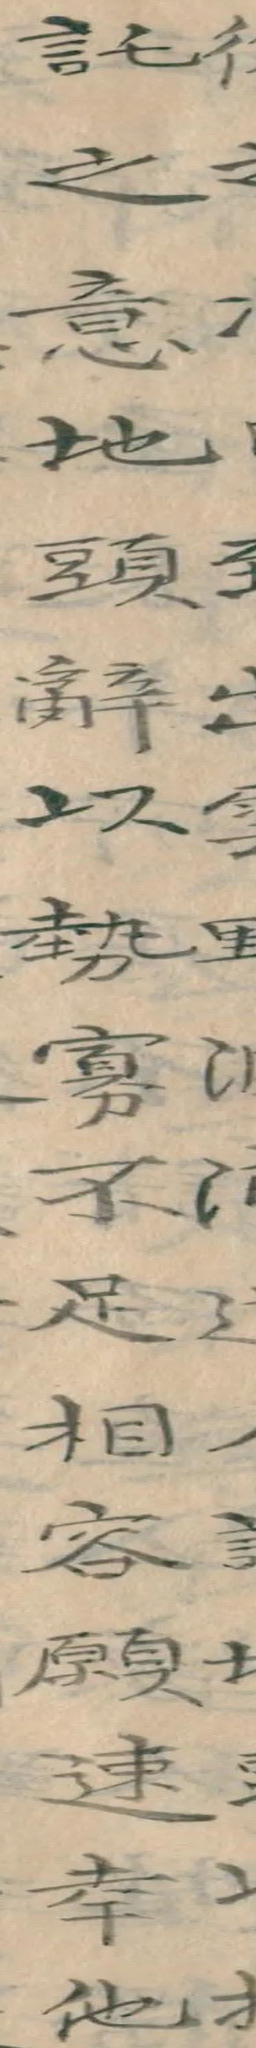託之意地頭辞以勢寡不足相容願速幸他
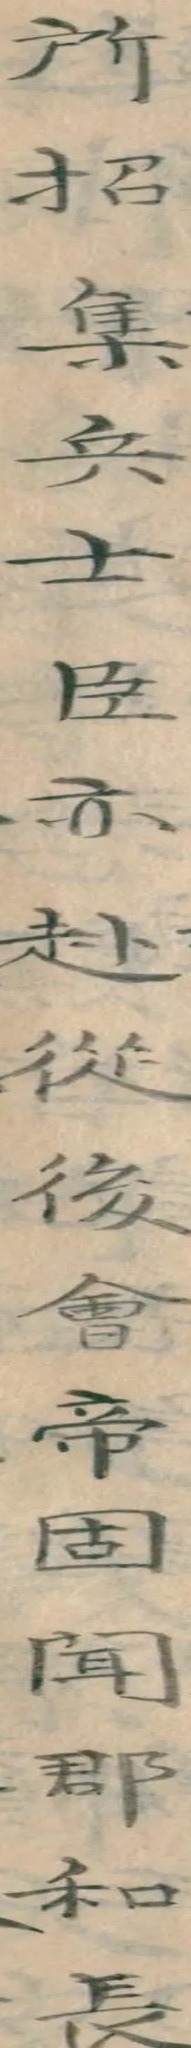所招集兵士臣亦赴従後会帝固聞郡和長
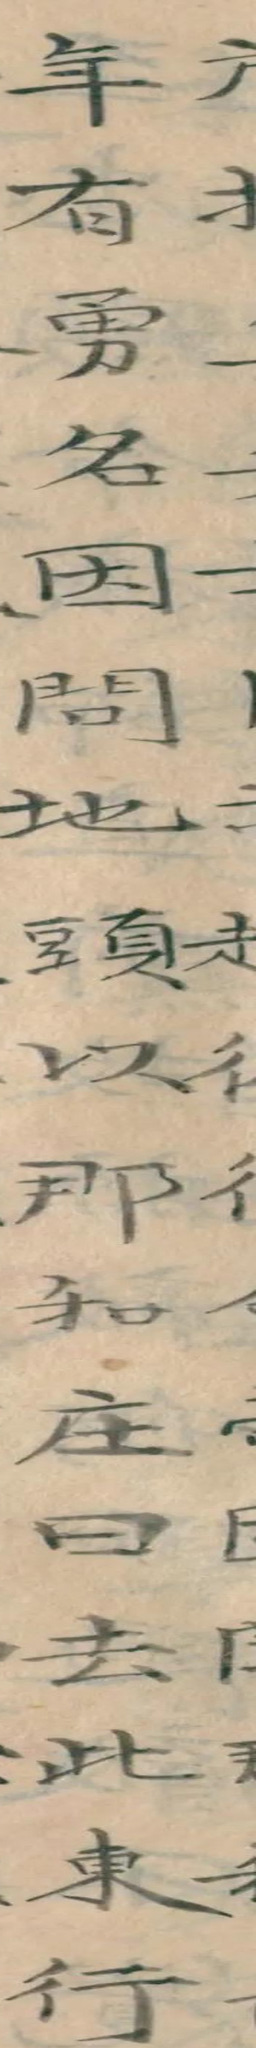年有勇名因問地頭以那和庄曰去此東行
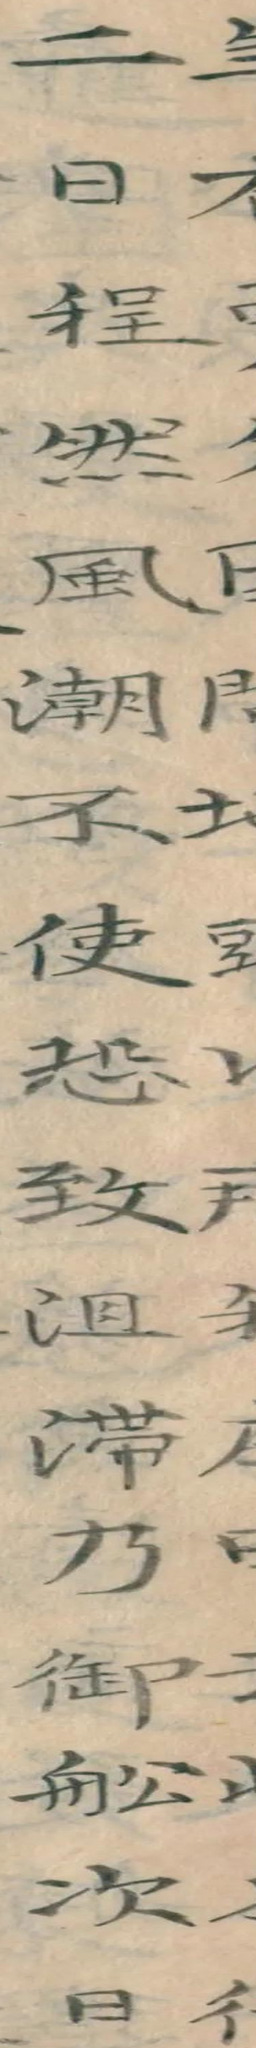二日程然風潮不使恐致沮滞乃御船次日
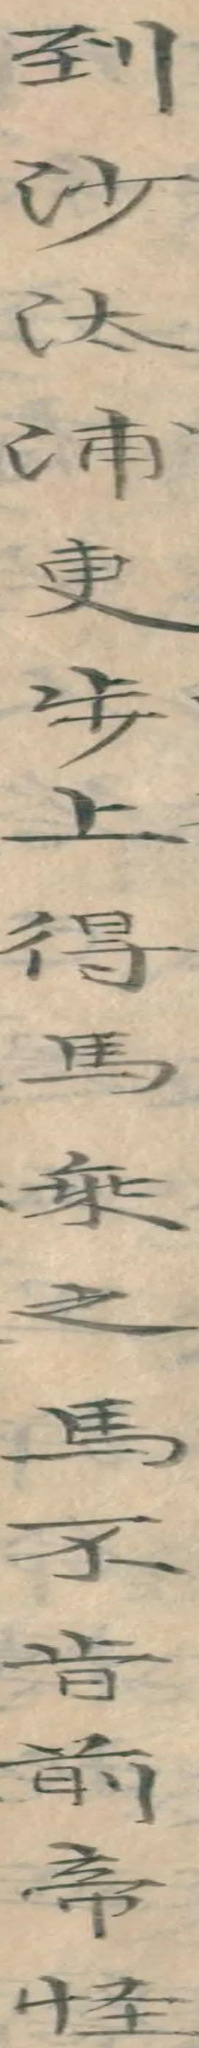到沙汰浦歩上得馬乗之馬不前帝怪
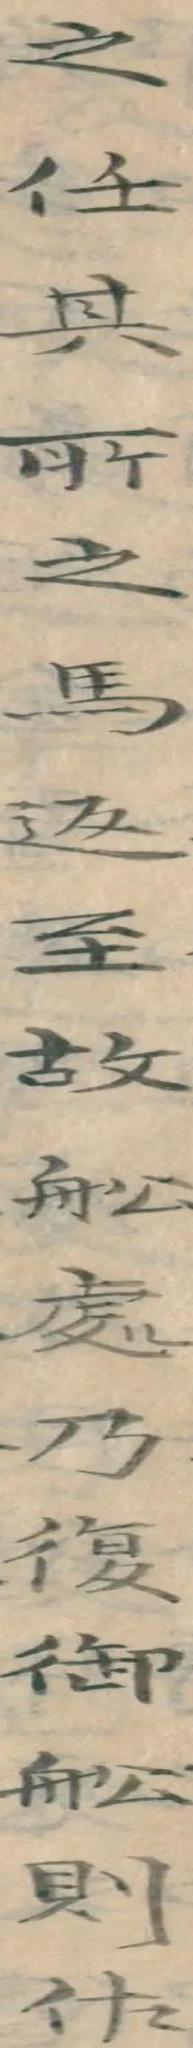之任其前之馬返至故船処乃復御船則佐
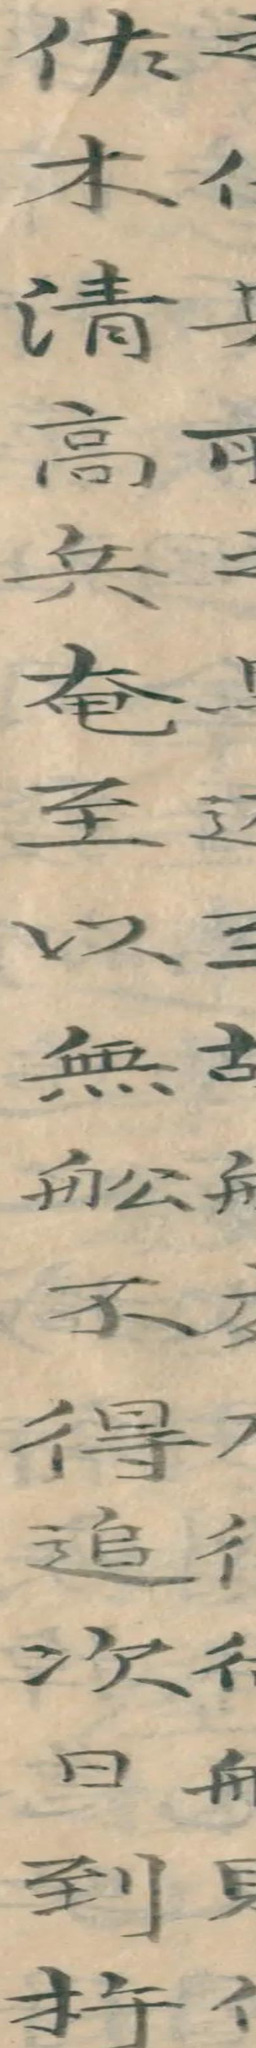佐木清高兵奄至以無船不得追次日到杵

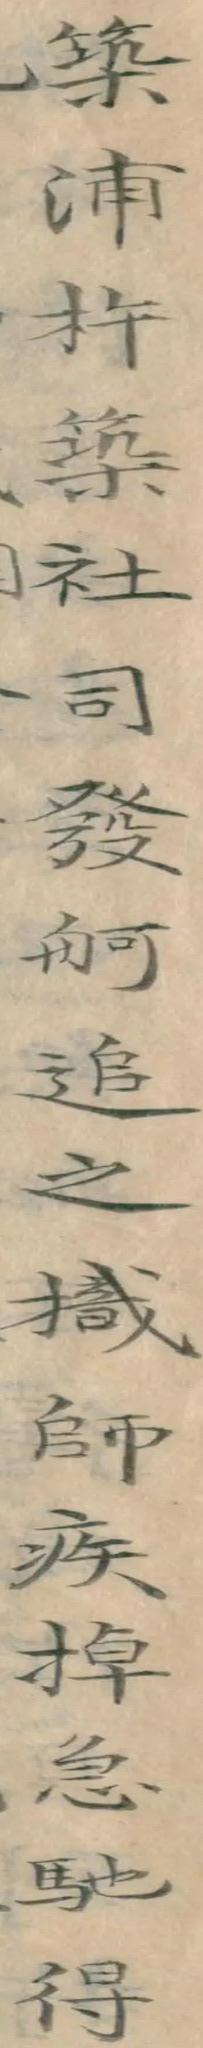築浦杵築社司発舸追之樴師疾棹急馳得
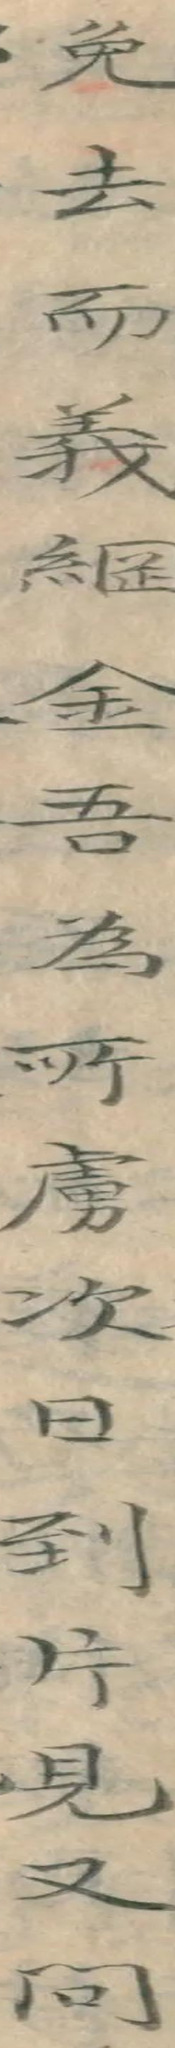免去而義綱金吾為所虜次日到片見又問
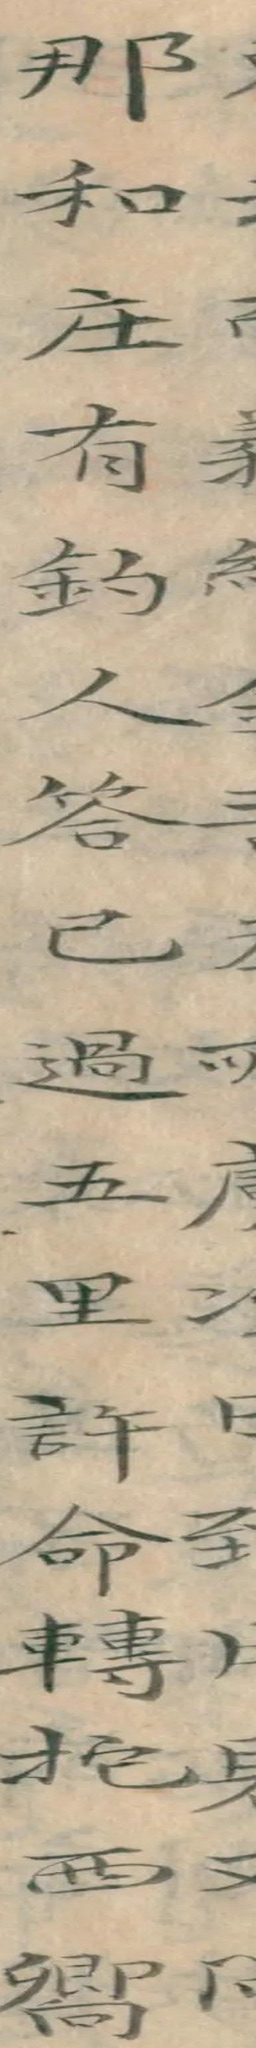那和庄有釣人答已過五里許命転拕西嚮
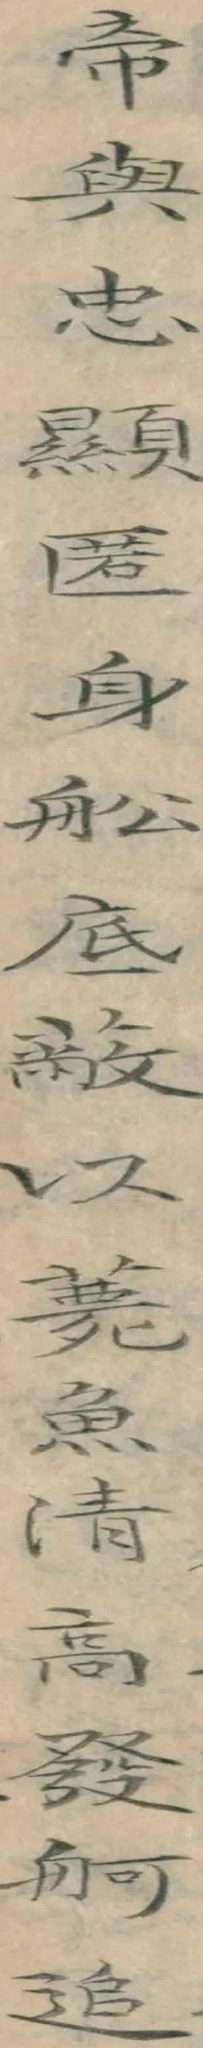帝与忠顕匿身船底蔽以魚清高発舸追
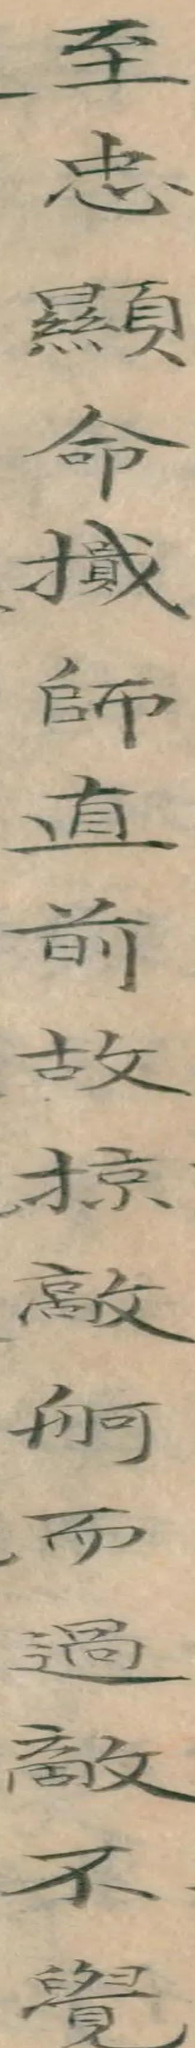至忠顕命師直前故掠舸而過敵不覚
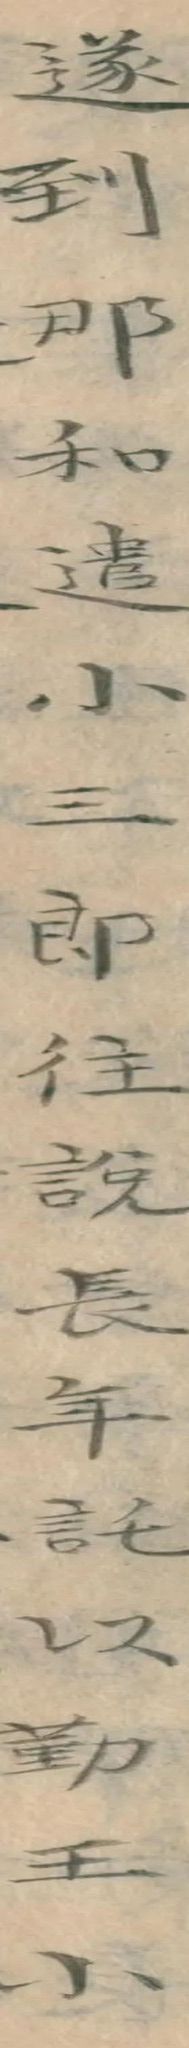遂到那和遣小三郎往説長年以勤王小
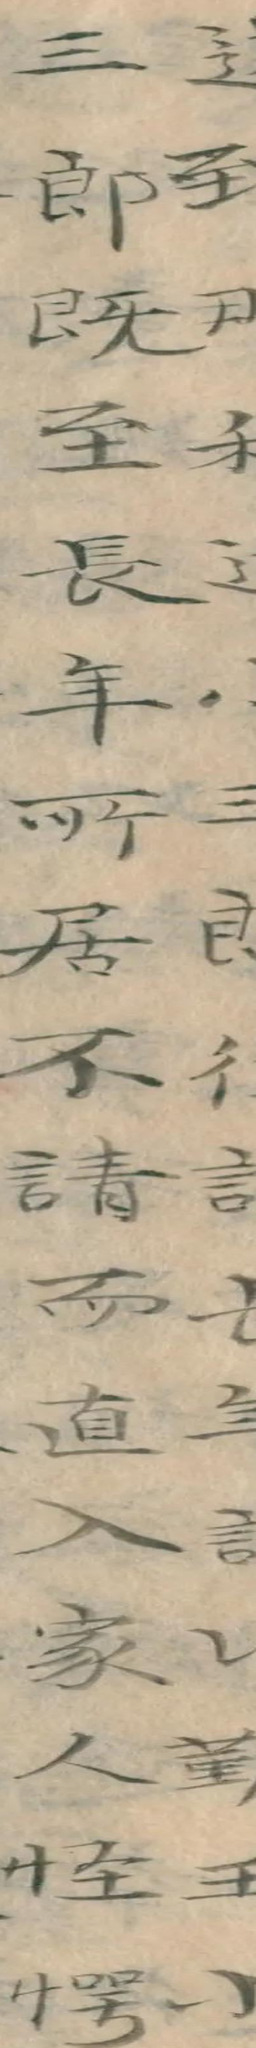三郎既至長年所居不請而直入家人怪愕
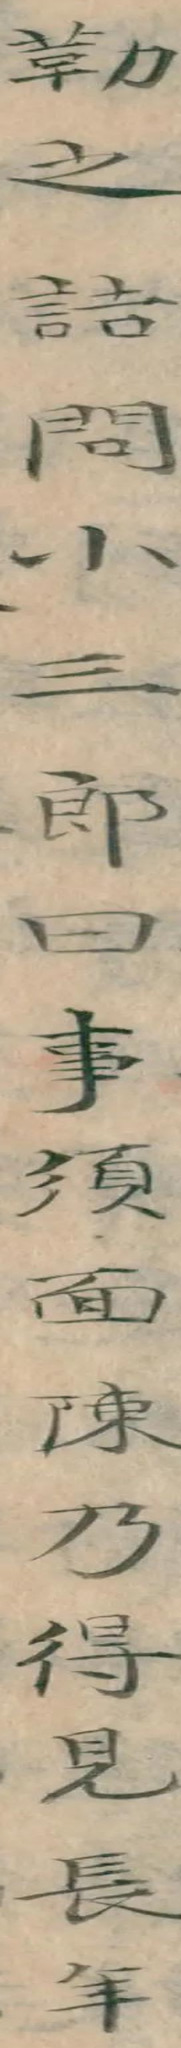之詰問小三郎曰事須面陳乃得見長年
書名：輪池叢書. 12
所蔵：国立国会図書館 National Diet Library, JAPAN
